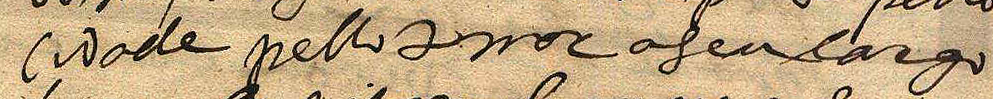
Cidade pello tomar a seu cargo
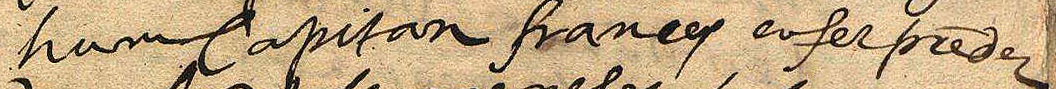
hum Capitam frances e o fez prēder
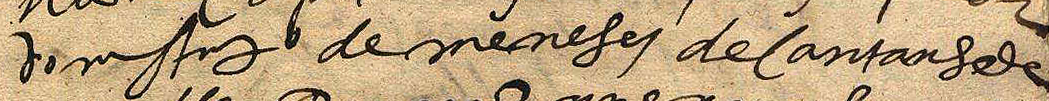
dom Anto de meneses de Cantanhede
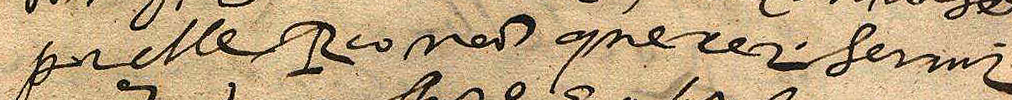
por elle Reo naõ querer seruir
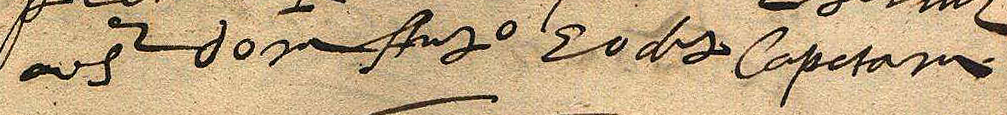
ao sor dom Anto E o dito Capitam
